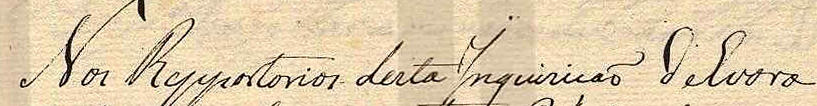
Nos Repportorios desta Jnquiziçaõ de Evora
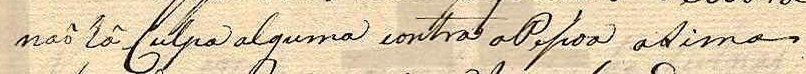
naõ há Culpa alguma contra a Pessoa asima
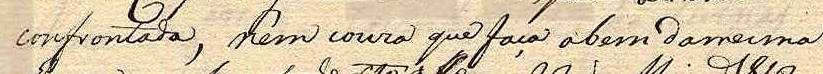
confrontada, nem couza que faça o bem da mesma
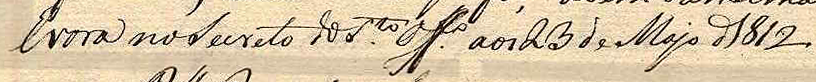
Evora no Secreto do S.to Off.o aos 23 de Majo d̄ 1812
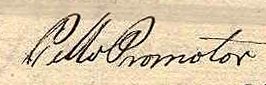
Pello Promotor
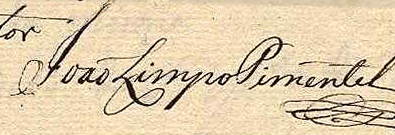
Ioaõ Limpo Pimentel
